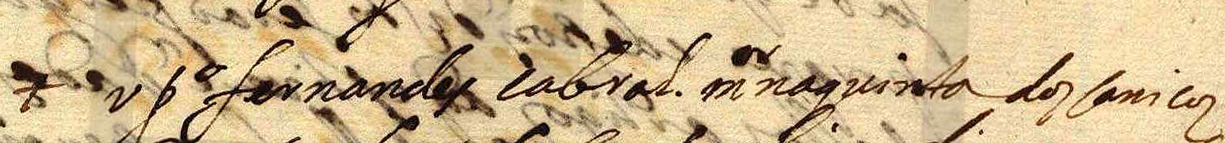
t o po fernandes cabral. mor na quinta dos Caniços
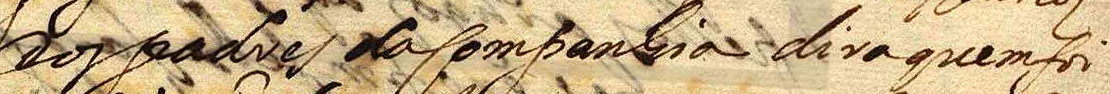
dos padres da Companhia dira quem foi
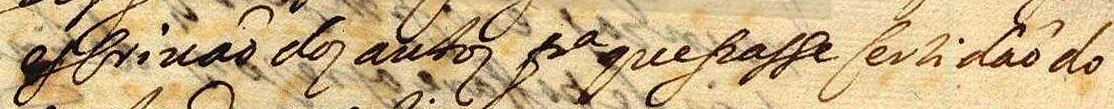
escriuaõ dos autos pa que passe Certidaõ do
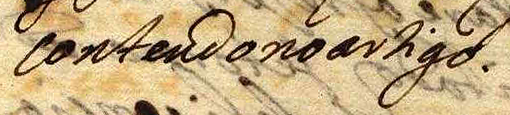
conteudo no artigo.
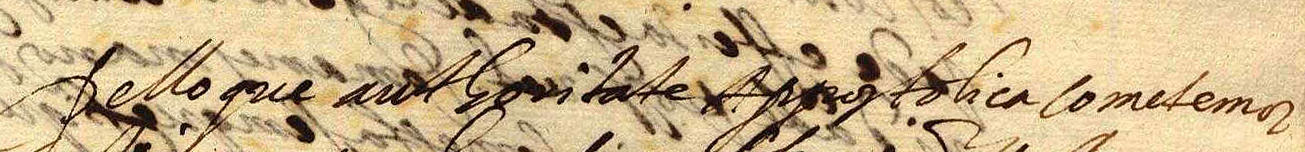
Pello que authoritate Appostolica cometemos
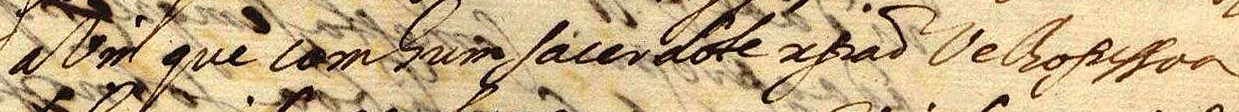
a Vm que com hum sacerdote xpaõ Velho pessoa
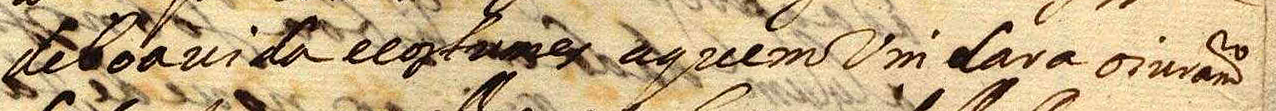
de boa uida e costumes a quem Vm dara o iuramto
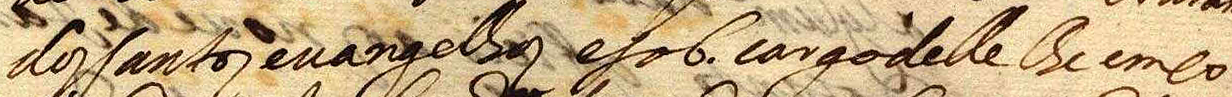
dos santos euangelhos e sob cargo delle lhe emco
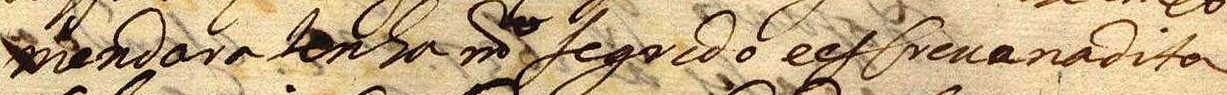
mendara tenha mto segredo e esCreua na dita
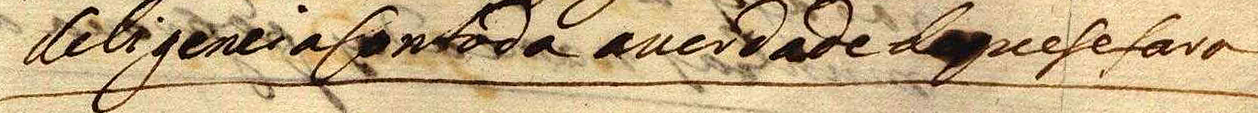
deligencia Con toda a uerdade de que se fara
